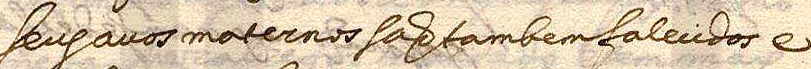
Seus auos maternos saõ tambem falecidos e
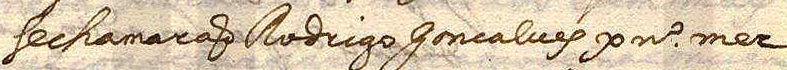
se chamaraõ Rodrigo Goncalues xno. mer
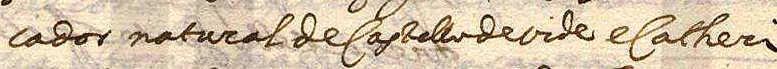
cador naturaL de Castello de vide e Catheri
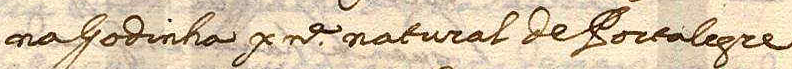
na Godinha xn.a natural de Portalegre
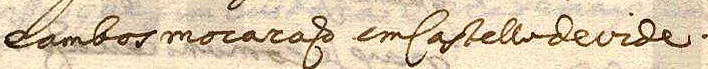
e ambos moraraõ em Castello de vide.
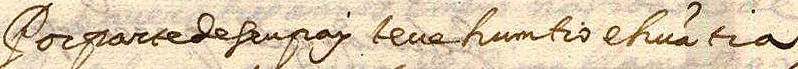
Por parte de seu pay teue hum tio e huā tia
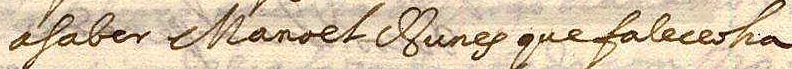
a saber Manoel Nunes que faleceo ha
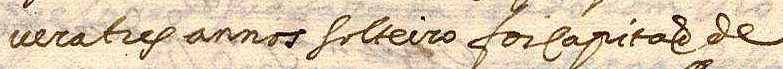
uera tres annos solteiro foi Capitaõ de
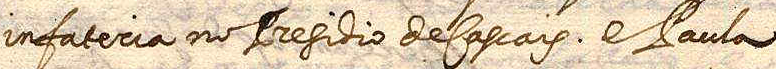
infateria no Presidio de Cascais. e Paula
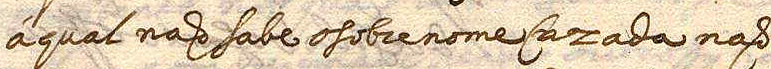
á quaL naõ sabe o sobrenome Cazada naõ
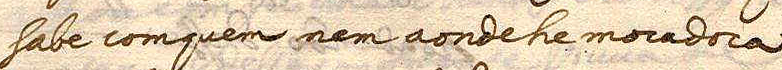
sabe com quem nem aonde he moradora
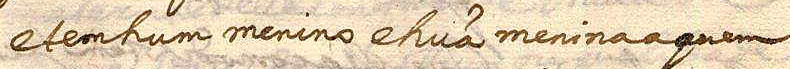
e tem hum menino e huā menina a quem
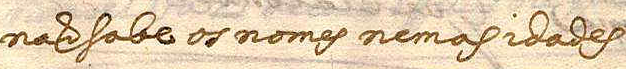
naõ sabe os nomes nem as idades
